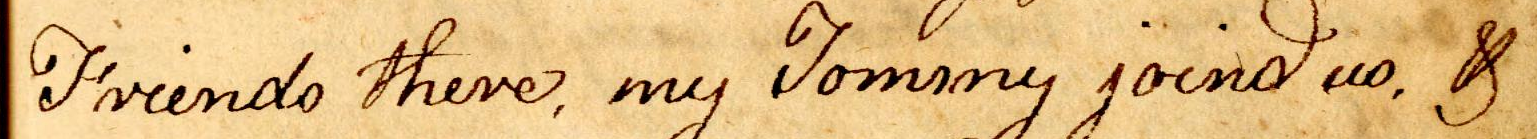Friends there, my Tommy joind us. &
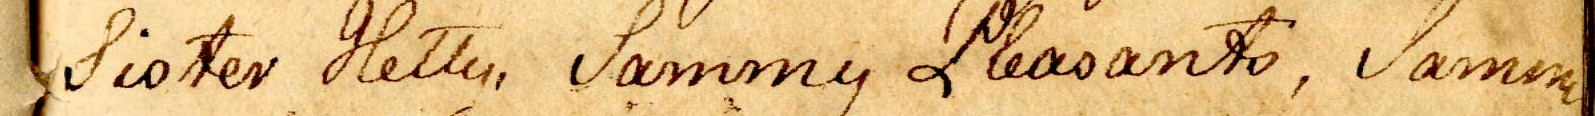Sister Hetty, Sammy Pleasants, Sammy
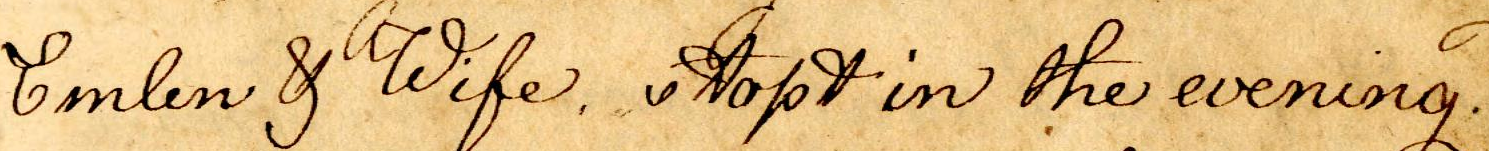Emlen & Wife, stept in the evening.
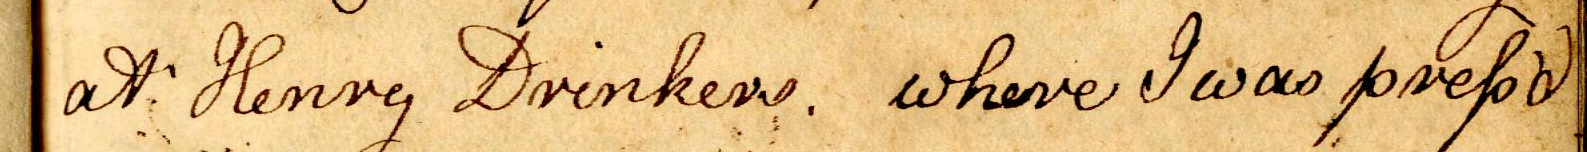at Henry Drinkers. where I was prep'd
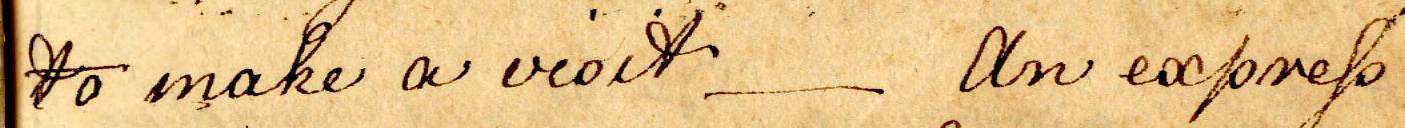to make a visit - An express
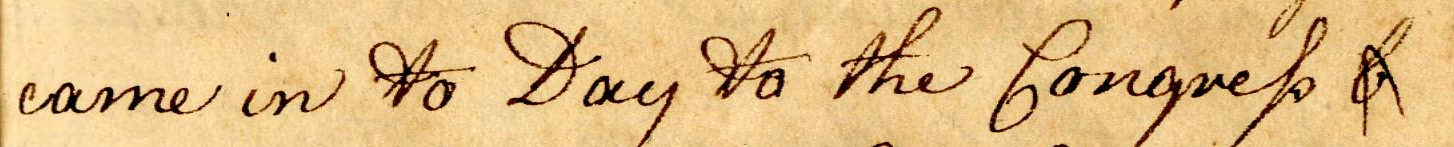came in to Day to the Congress [&]
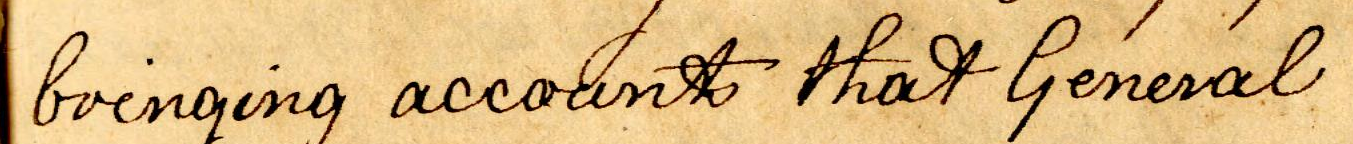bringing accounts that General
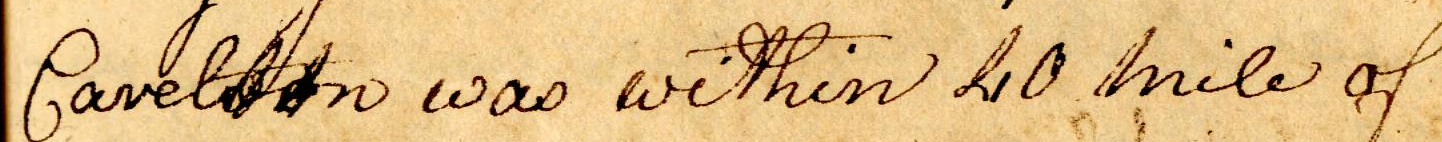Carel[to]n was within 40 mile of
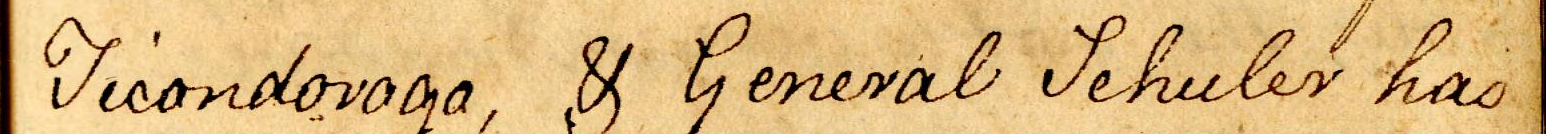Ticondoroga, & General Schuler has
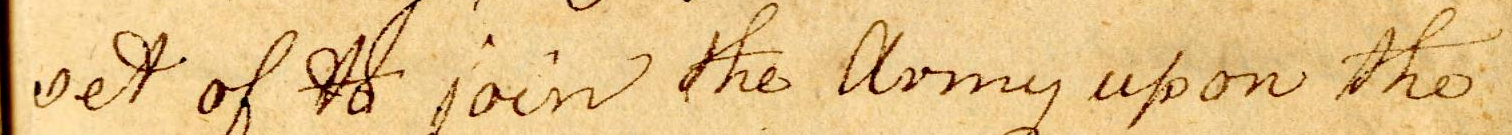set of to join the Army upon the
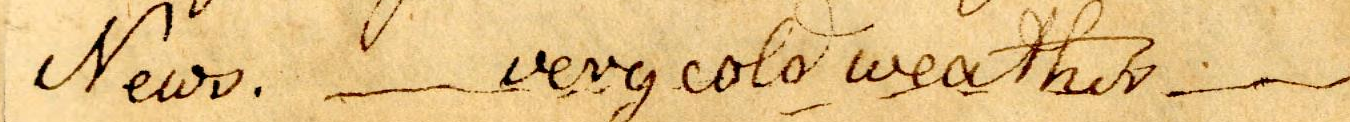News.- very cold weather-
